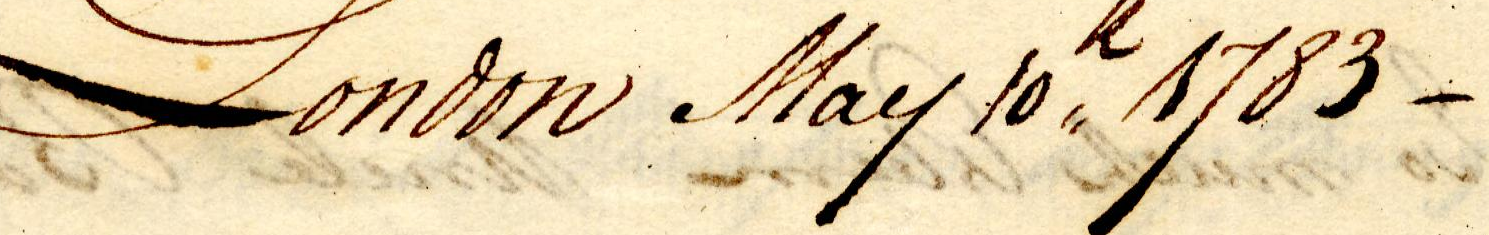London May 10^th, 1783
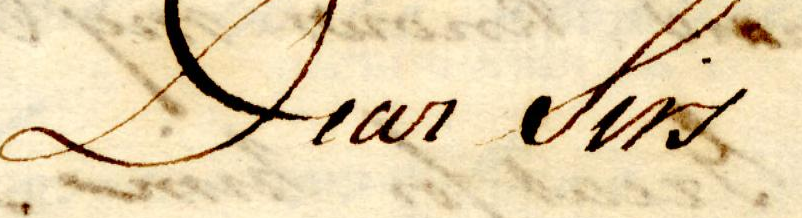Dear Sirs
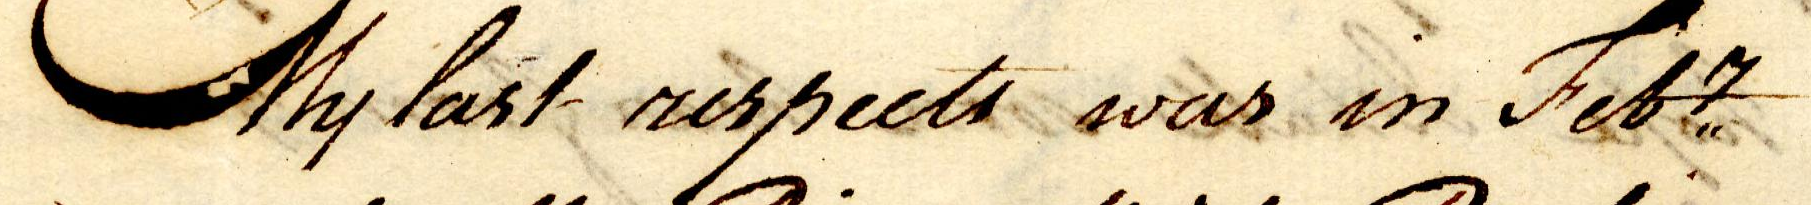My last respects was in Feb^y
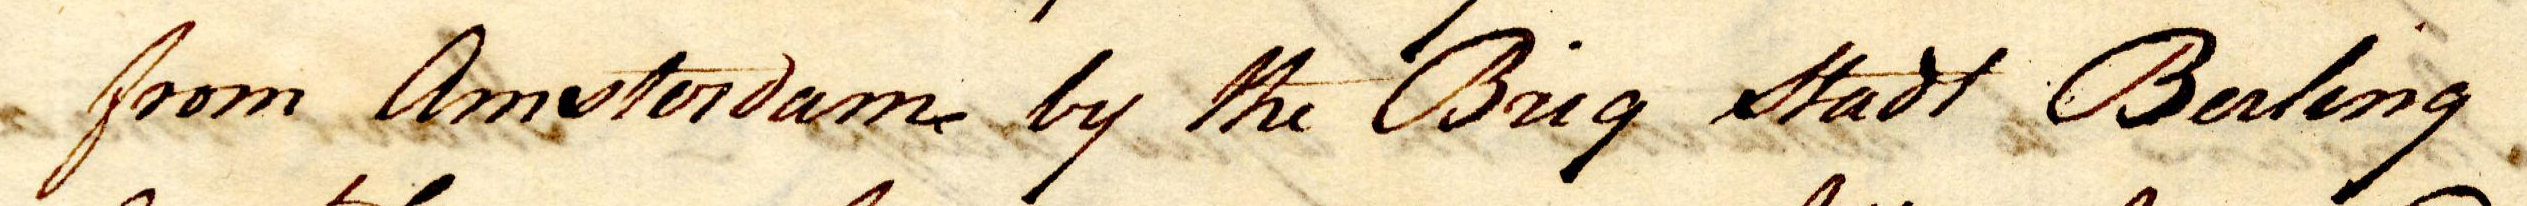from Amsterdam by the Brig Stadt Berling
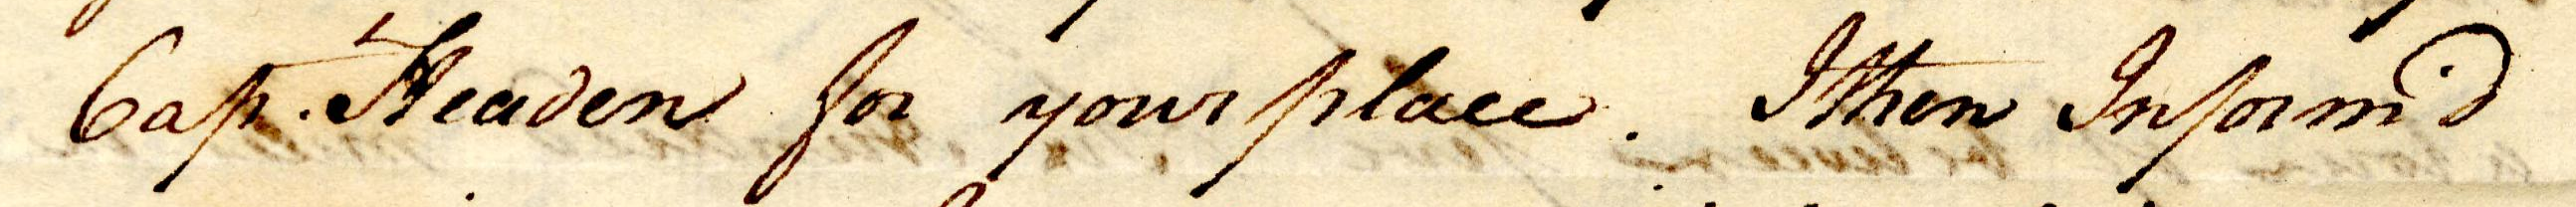Capt. Steaden for your place. I then Inform'd
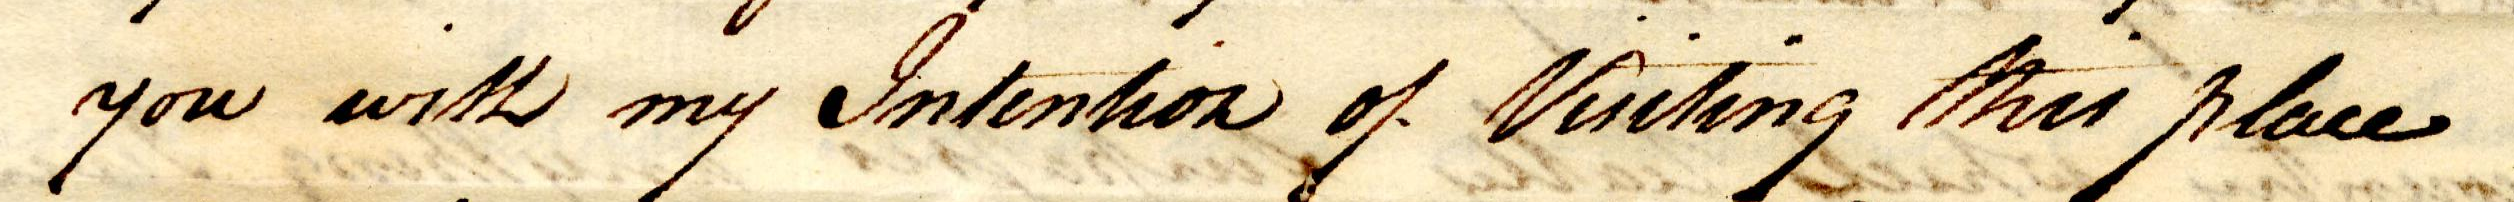you with my Intention of Visiting this place
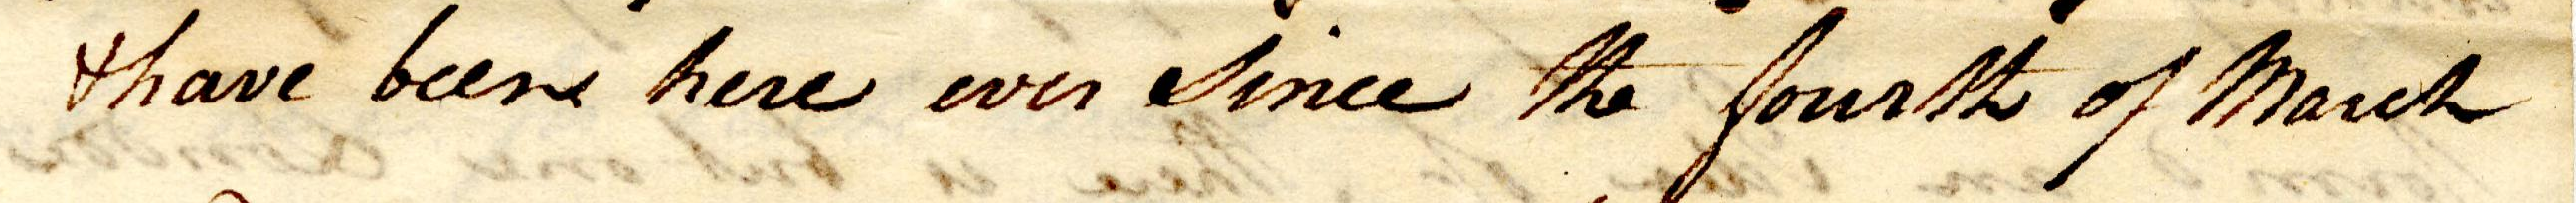& have been here ever since the fourth of March
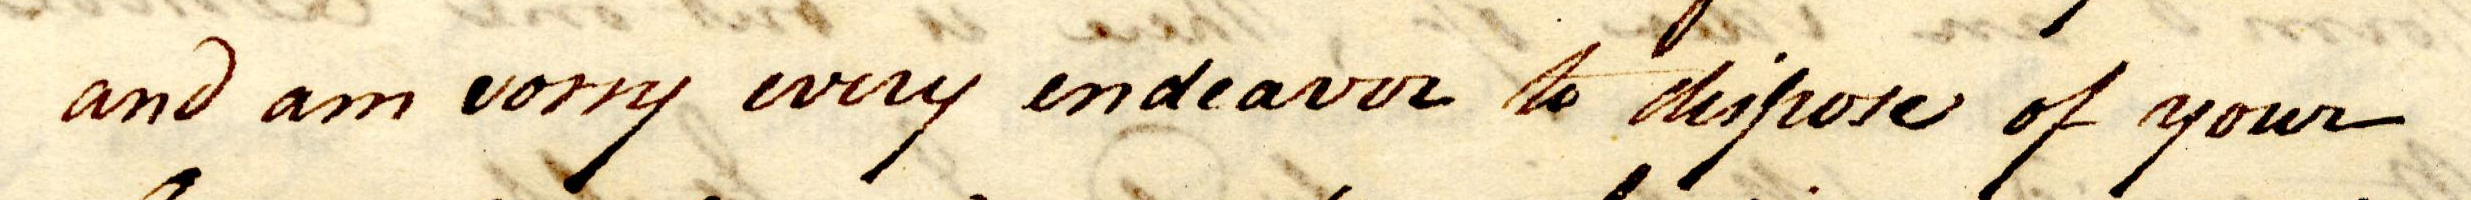and am sorry every endeavor to dispose of your
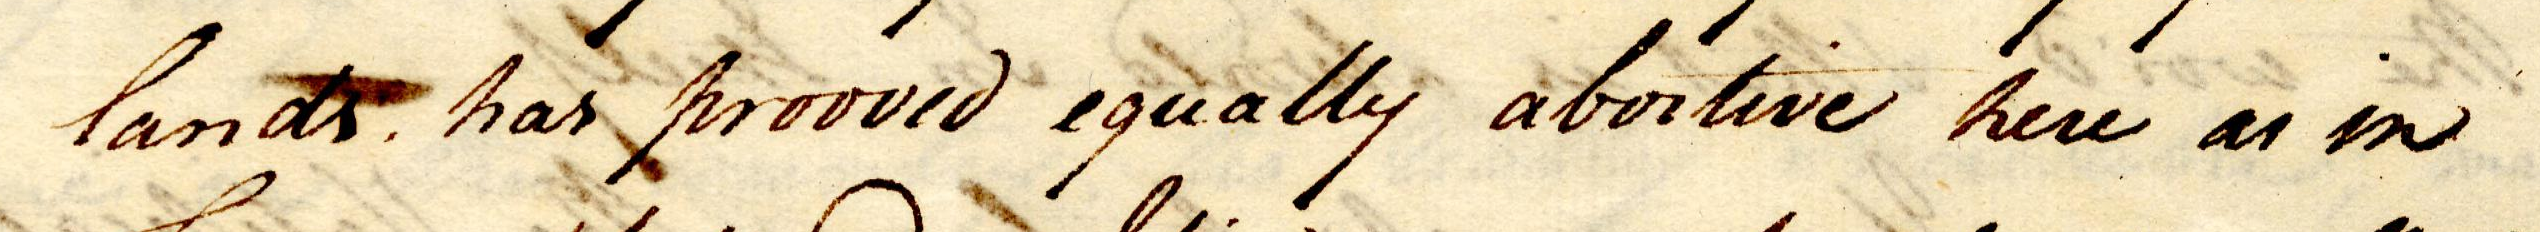lands has prooved equally abortive here as in
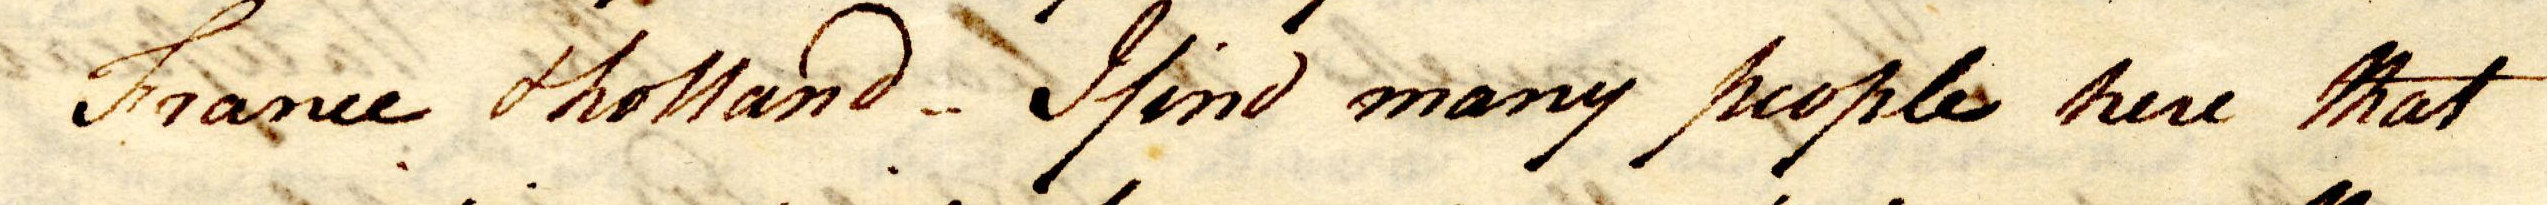France & holland. I find many people here that
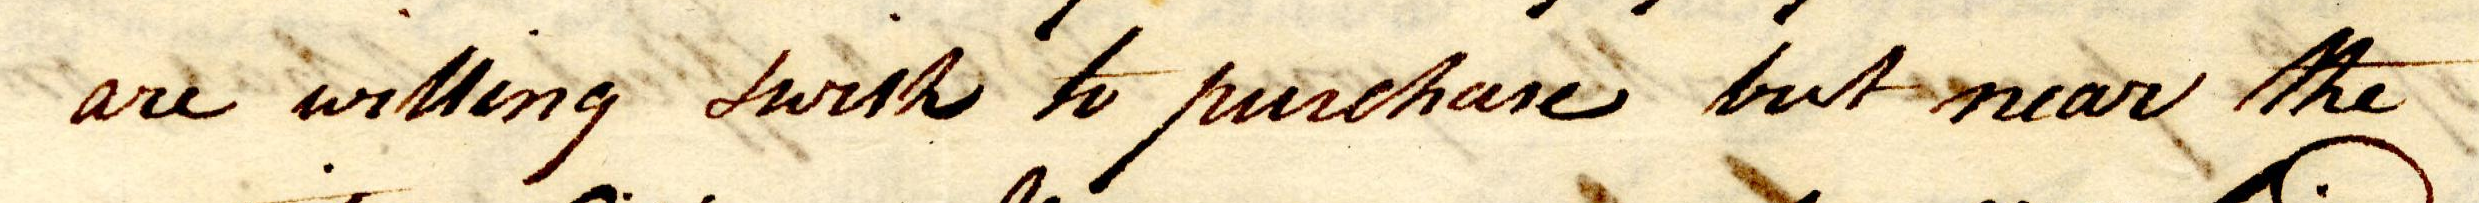are willing & wish to purchase but near the
